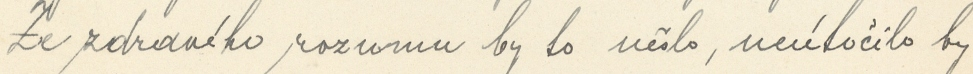Za zdravého rozumu by to nešlo, neútočilo by
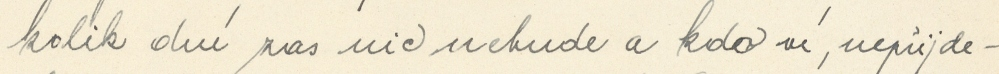kolik dní zas nic nebude a kdo ví, nepřijde-
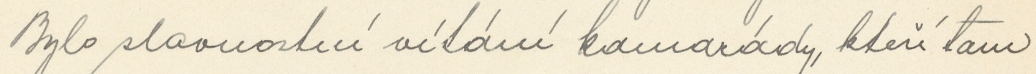Bylo slavnostní vítání kamarády, kteří tam
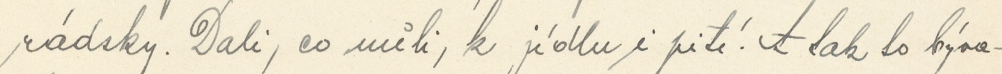rádsky. Dali, co měli, k jídlu i pití. A tak to býva-
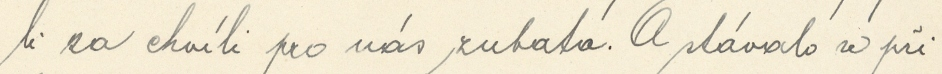li za chvíli pro nás zubatá. A stávalo se při
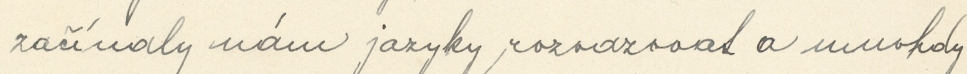začínaly nám jazyky rozvazovat a mnohdy
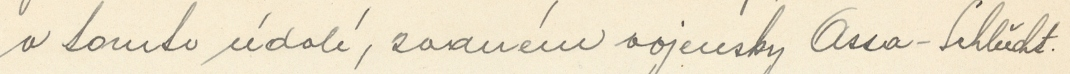v tomto údolí, zvaném vojensky Assa-Schlücht.
